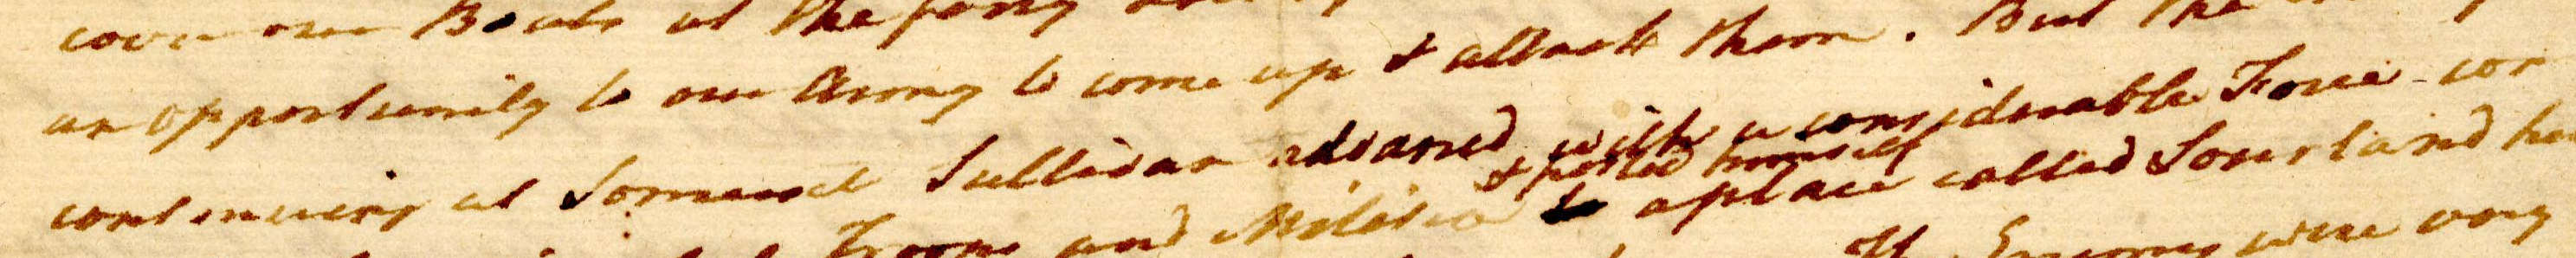concerning at Somerset Sullivan advanced, with a considerable Force con-
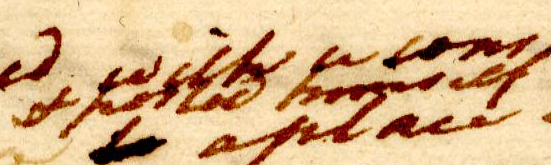& piled himself
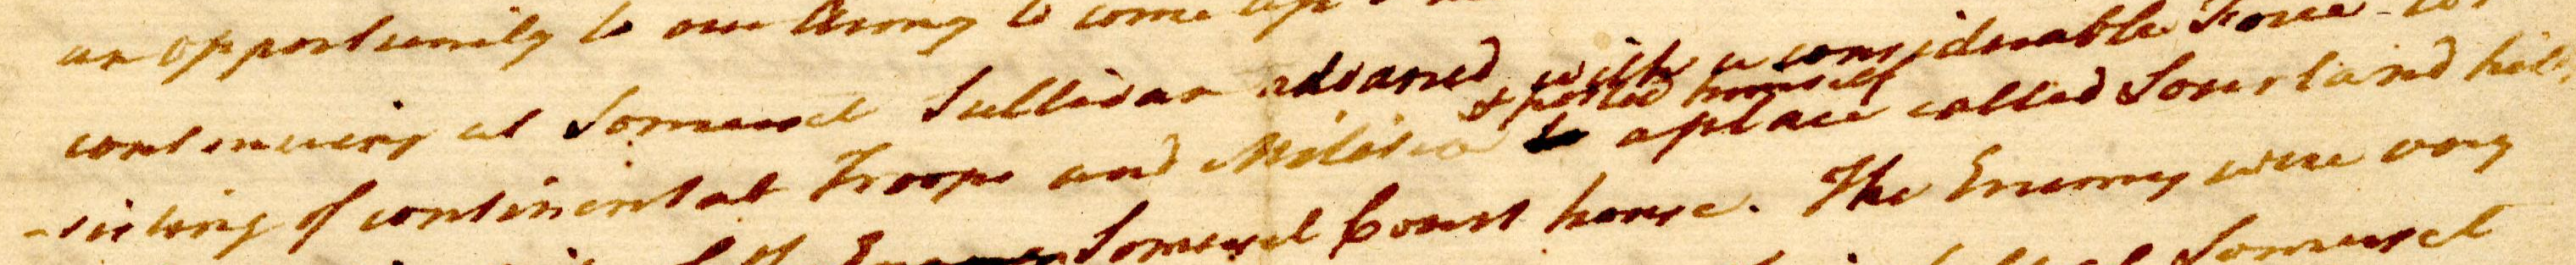-sisting of Continental Troops and Militia [to] a place called sourland had
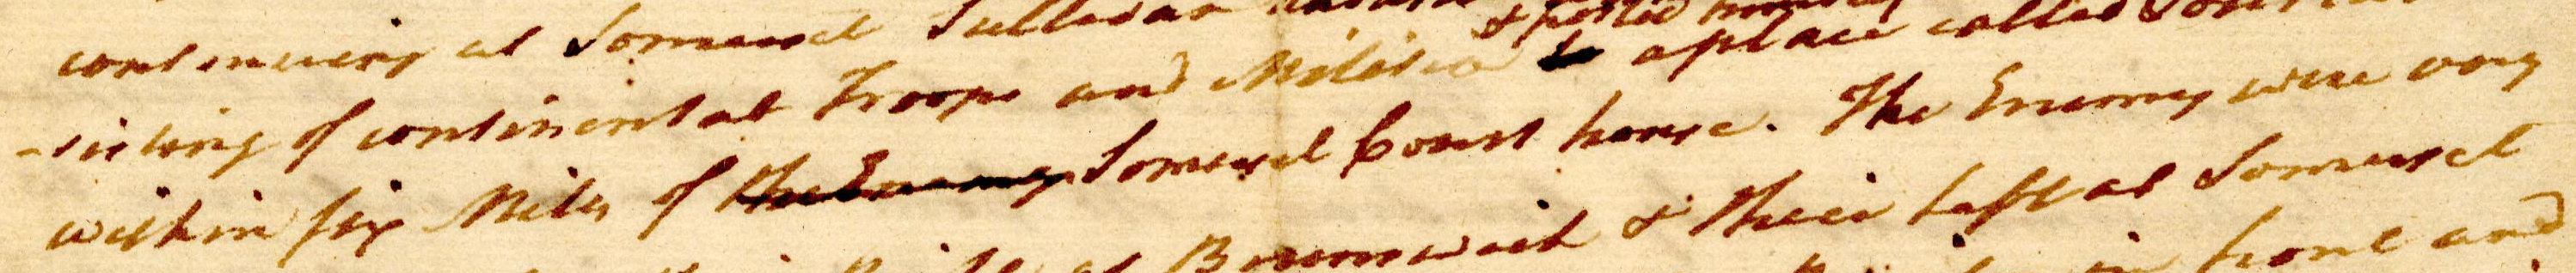within six Miles of [the] [Enemy] Somerset Court house. The Enemy were very
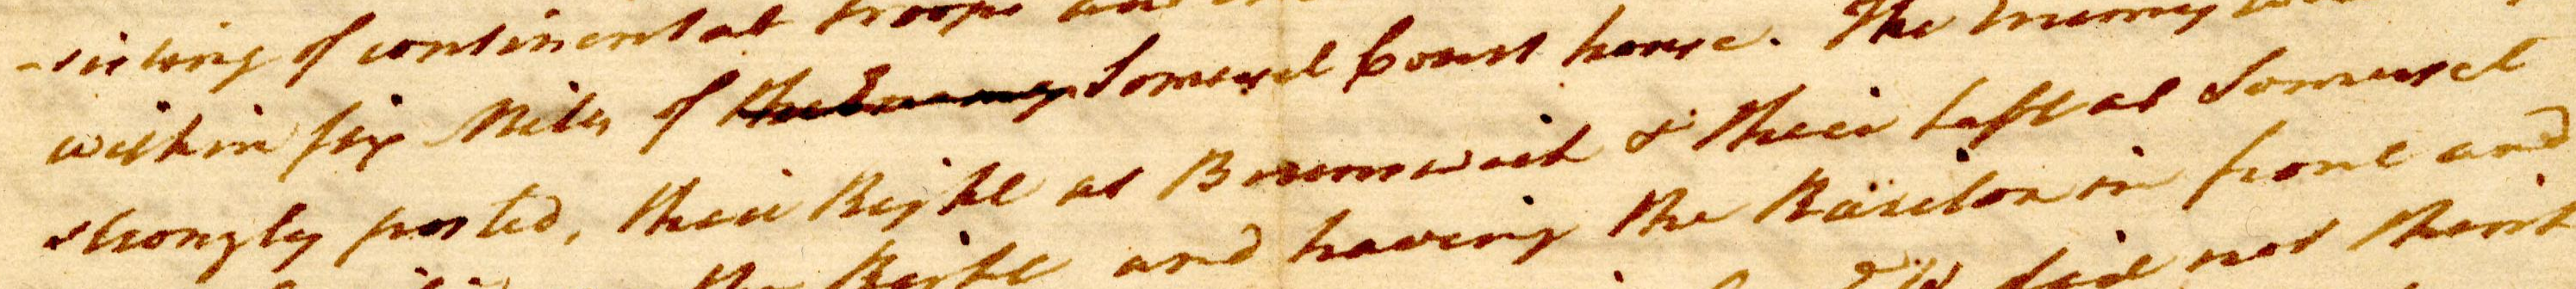strongly posted, their Right as Brunswick & their left as Somerset
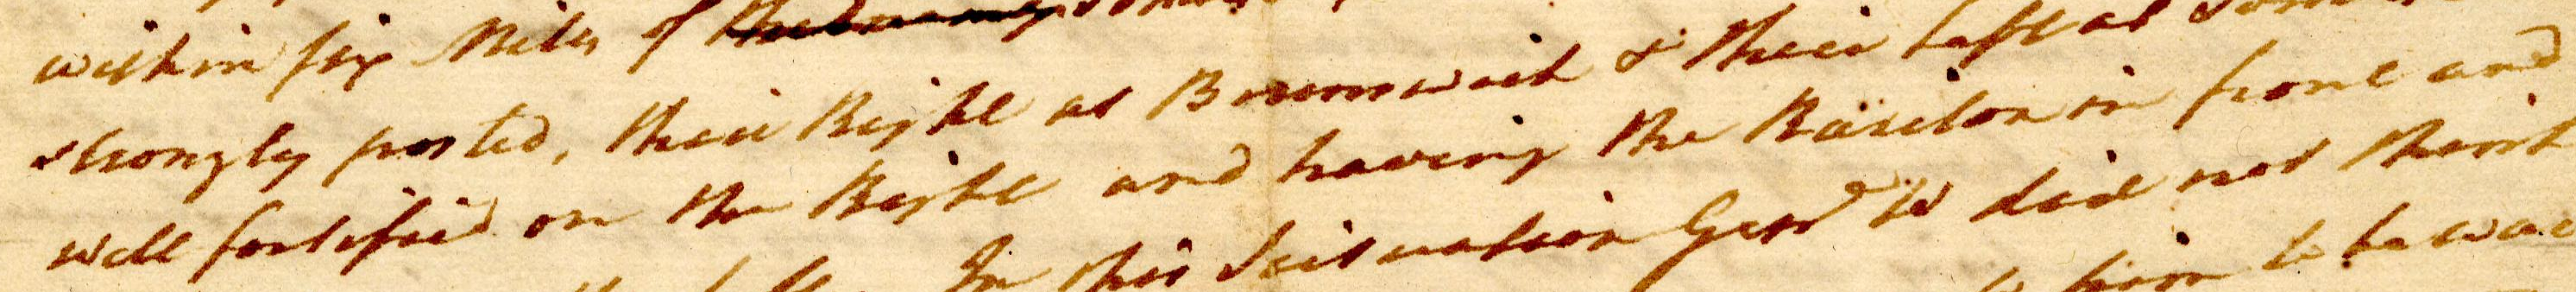well fortified on the Right and having the Rariton in front and
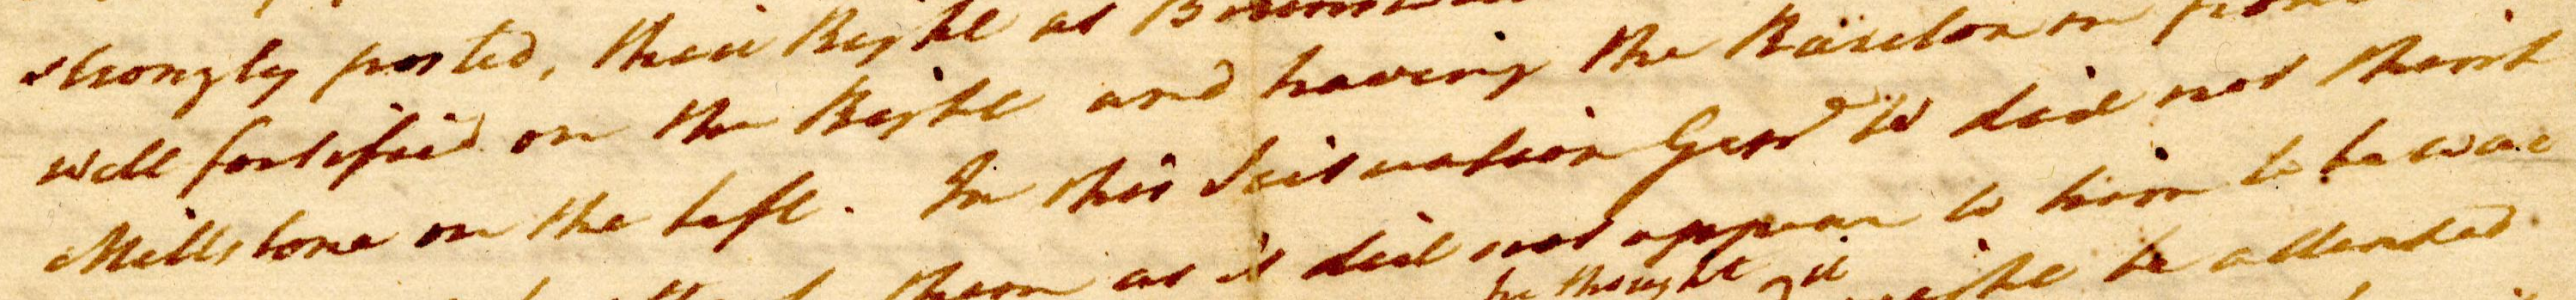Millstone on the left. In this Situation Gen^l W did not think
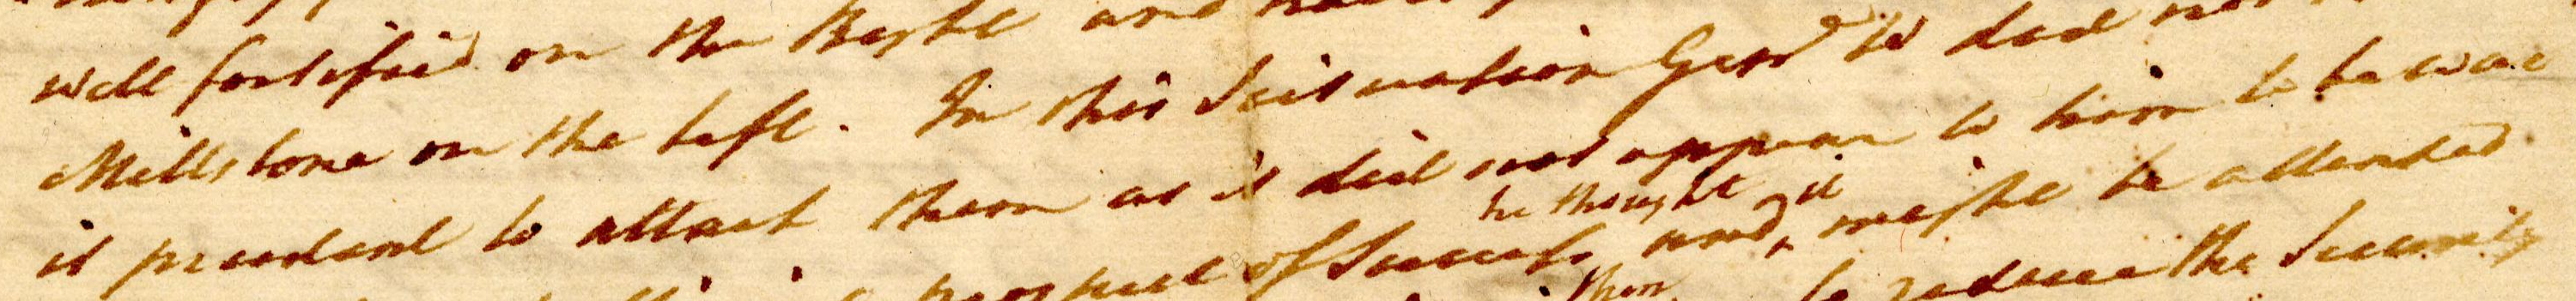it prudent to attack them as it did so appear to him to be war
